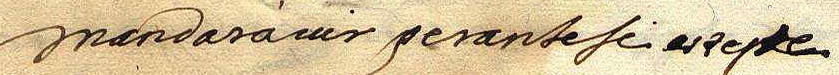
mandará uir perante si as teste
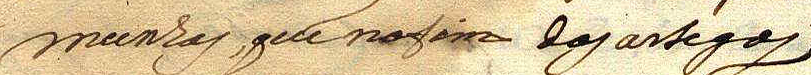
munhas, que no fim dos artigos
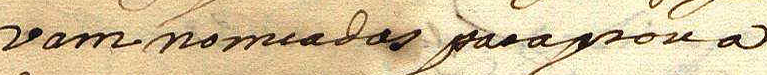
vam nomeadas para proua
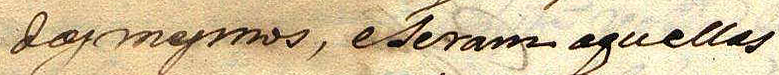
dos mesmos, e seram aquellas
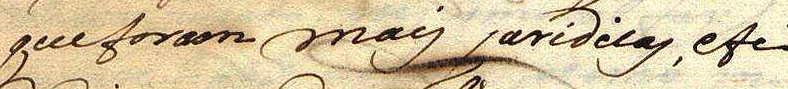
que foram mais juridicas, e fi
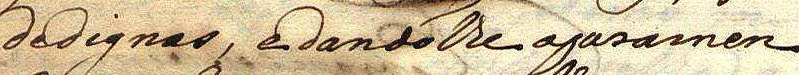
dedignas, e dando lhe o juramen
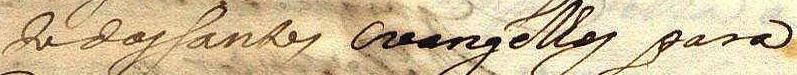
to dos santos evangelhos para
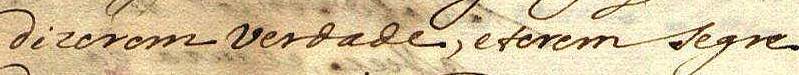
dizerem verdade, e terem segre
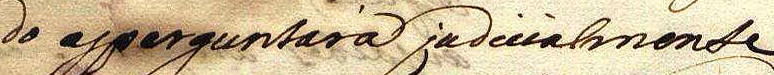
do as perguntara judicialmente
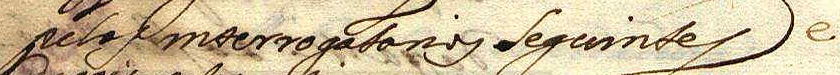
pelos interrogatorios seguintes e
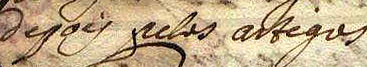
depois pelos artigos
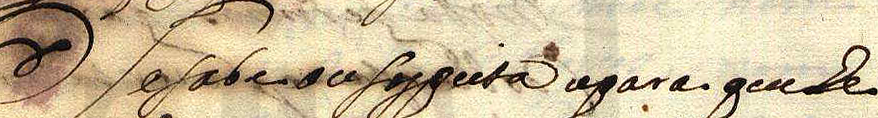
Se sabe ou sospeita o para que he
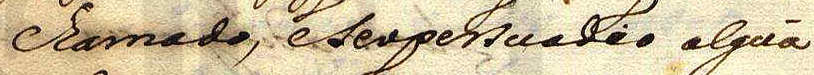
chamado, e se o persuadio alguā
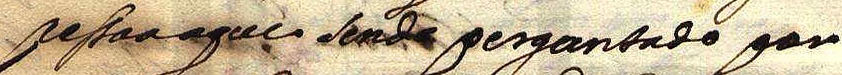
pessoa a que sendo perguntado por
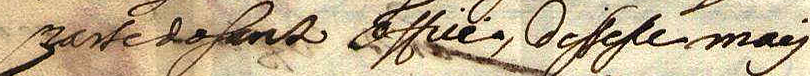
parte do santo officio, dissesse mais
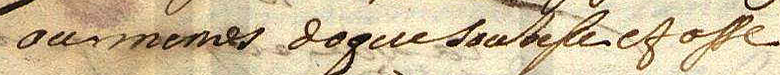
ou menos do que soubese e fosse
